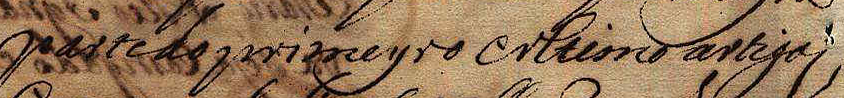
parte do primeyro e vltimo artigos
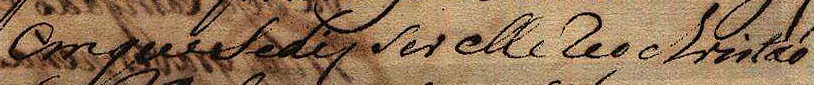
em que se dis ser elle Reo christaõ
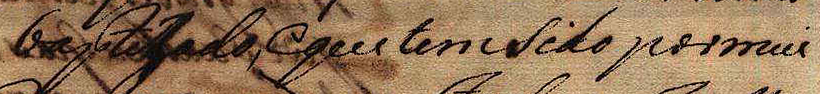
baptizado, E que tem sido por mui
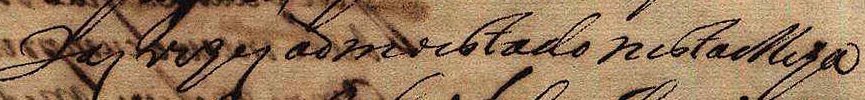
tas vezes admoestado nesta Meza
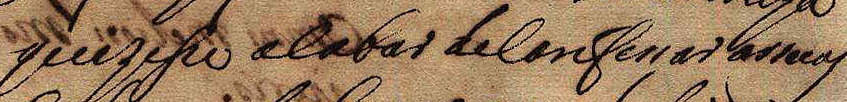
quizesse acabar de Confessar as suas
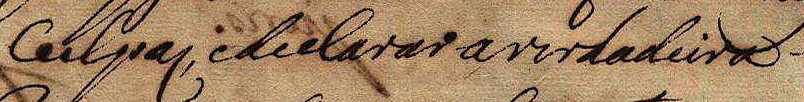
Culpas, e declarar a verdadeira
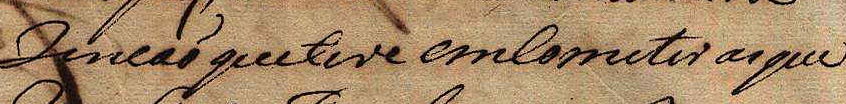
tençaõ que teve em cometer as que
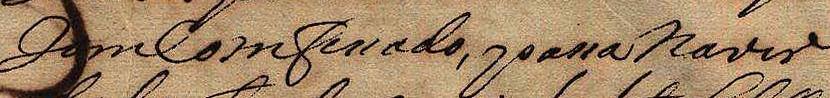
tem Comfessado, passa na ver
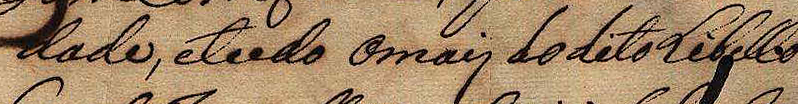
dade, e tudo o mais do dito Libello
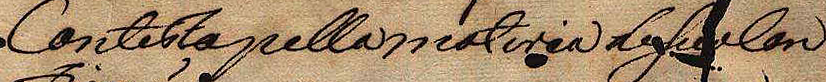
Contesta pella materia de sua Con
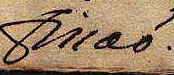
fissaõ.
